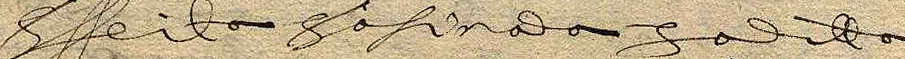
effeito e asinada ha ditta
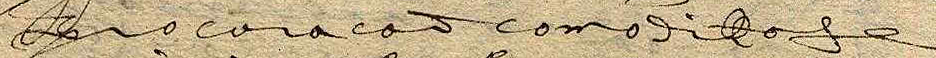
procuracaõ como ditto he
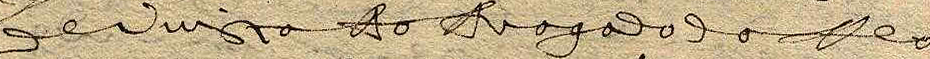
deo uista ao avogado do Reo
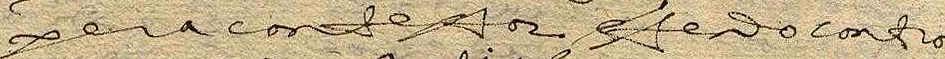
pera contestar e tendo contra
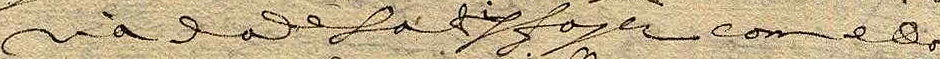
riado de satisfazer com elle
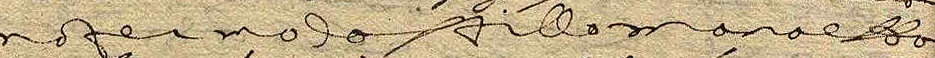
no termo do stillo manoell da
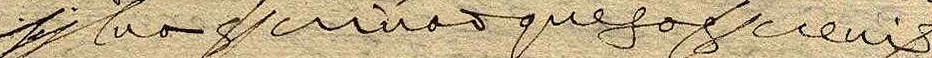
Sjlva escriuaõ que ho escreui
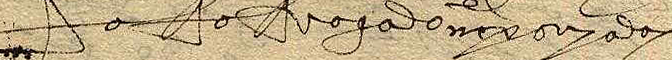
Ao Avogado mel pouzados
